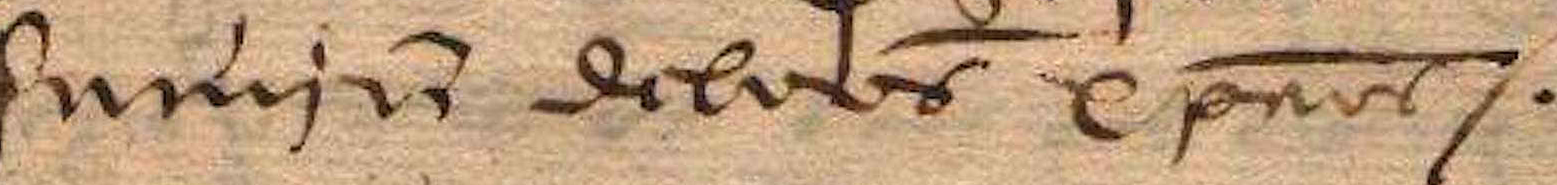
sumjrē de boos̄ xpaõs /.
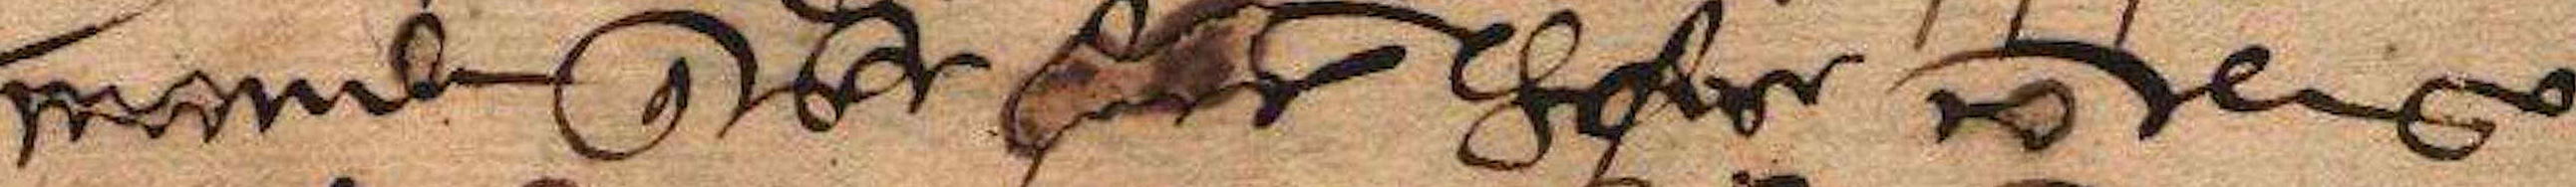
mandou q̄ este __tō lhe fose c̄ocluso
